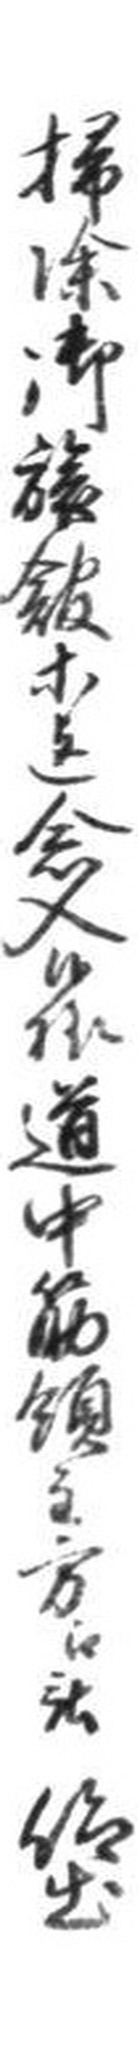掃除御旅館等迄念入候様道中筋領主方江被仰出
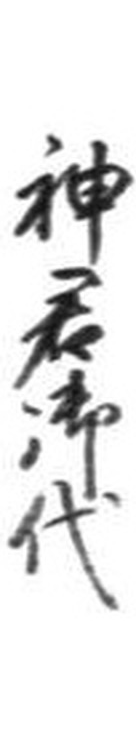神君御代
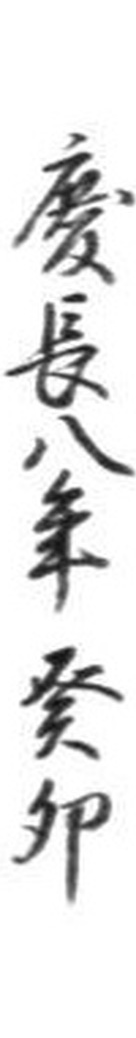慶長八年癸卯
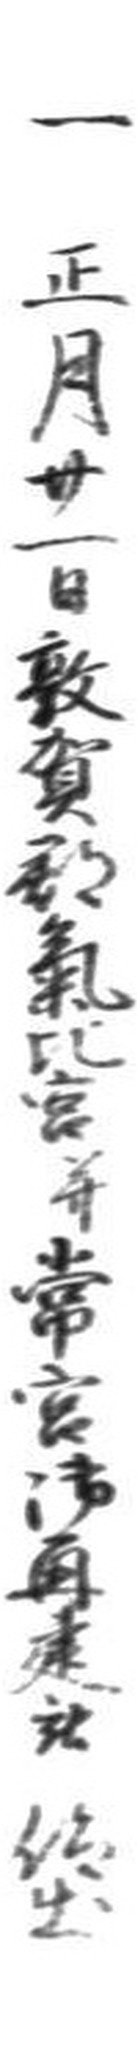一正月二十一日敦賀郡気比宮并常宮御再建被仰出

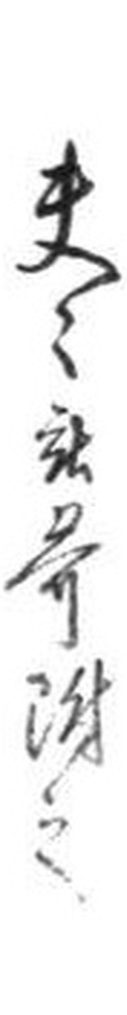夫々被寄附之
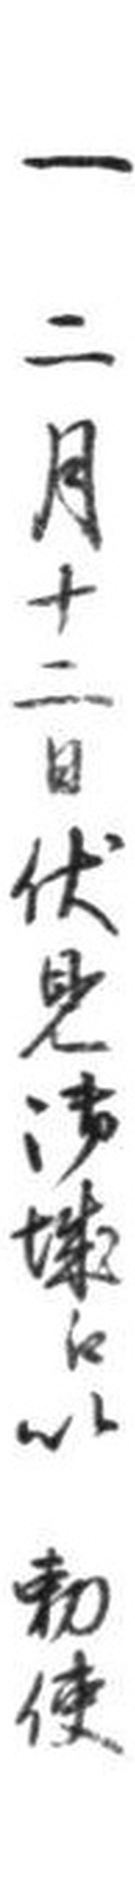一二月十二日伏見御城江以勅使
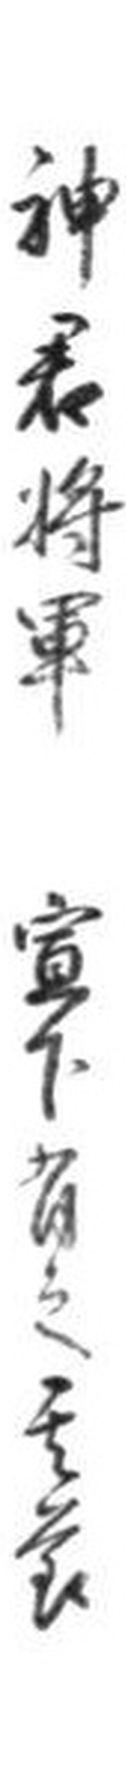神君将軍宣下有之其節
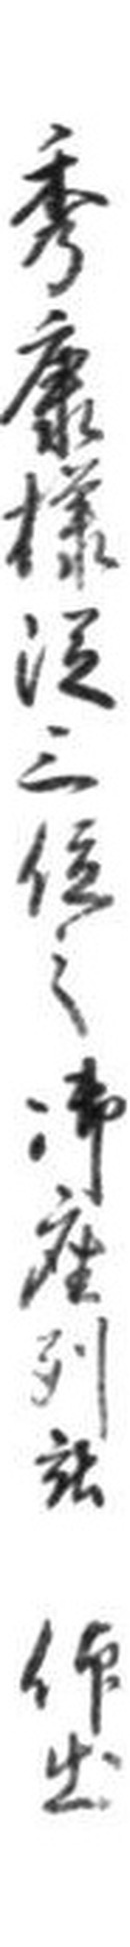秀康様源三位之御座列被仰出
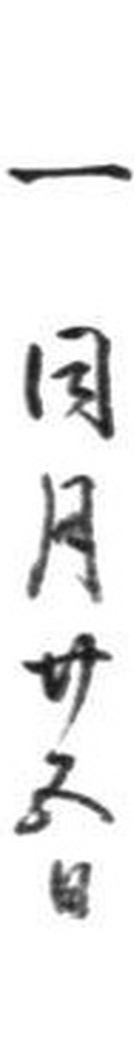一同月廿五日
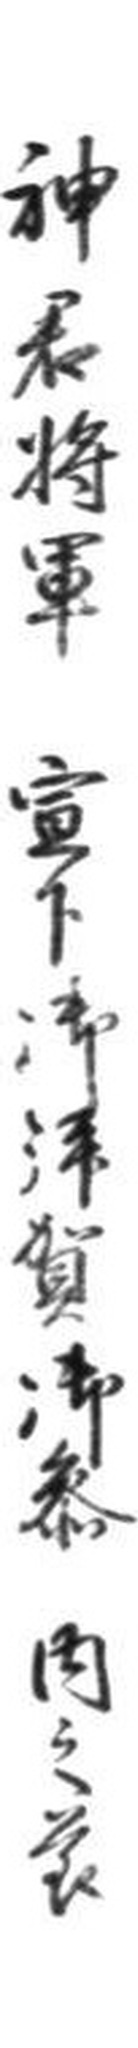神君将軍宣下御拝賀御参内之節
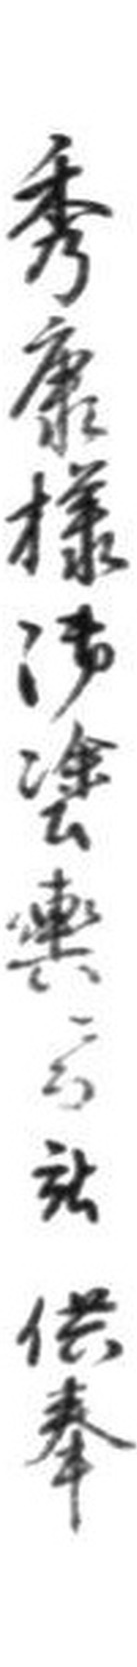秀康様御塗輿ニ而被供奉
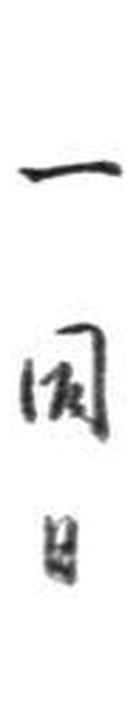一同日
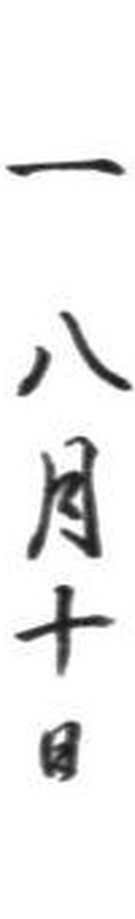一八月十日
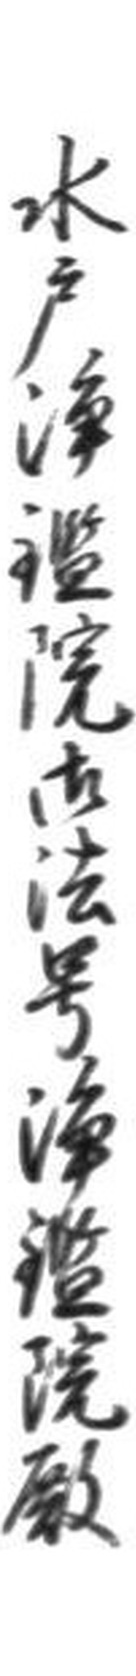水戸浄鑑院御法号浄鑑院殿

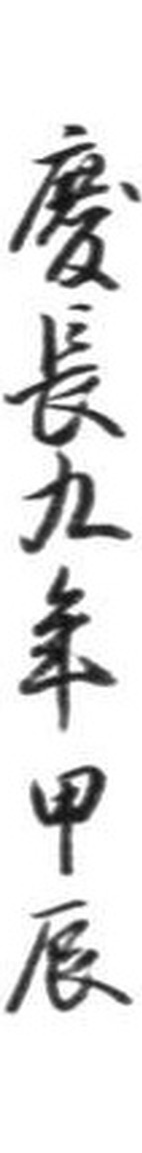慶長九年甲辰
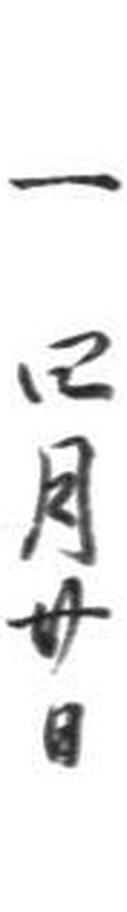一四月廿日
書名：家譜 一 秀康公 従天正二年到慶長十二年
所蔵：福井県文書館 Fukui Prefectural Archives
